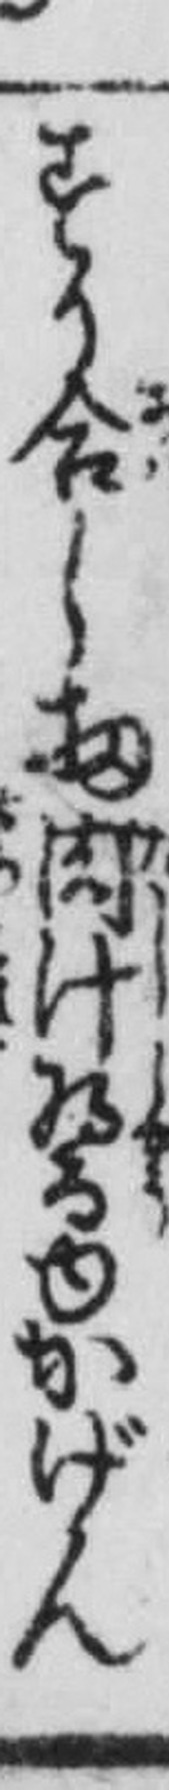すり合し扨肉汁醤ゆかげん
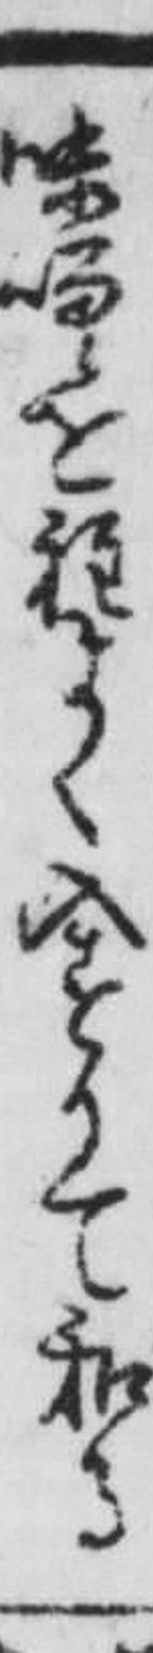味噌を程よく入すりて和る
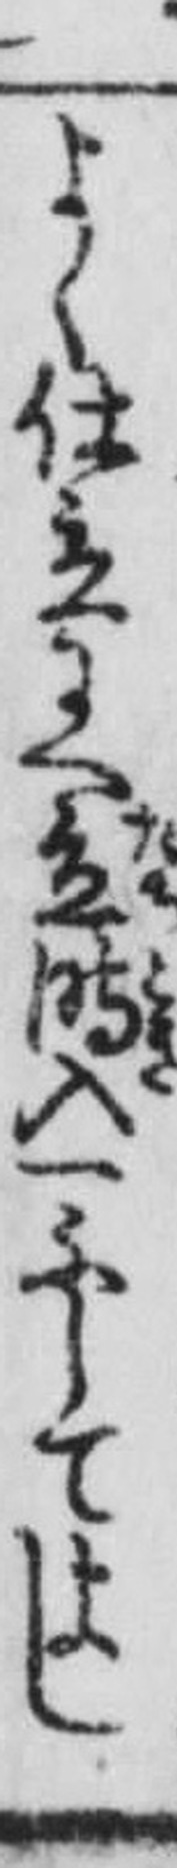よく仕立にへ立時入一ふしてよし
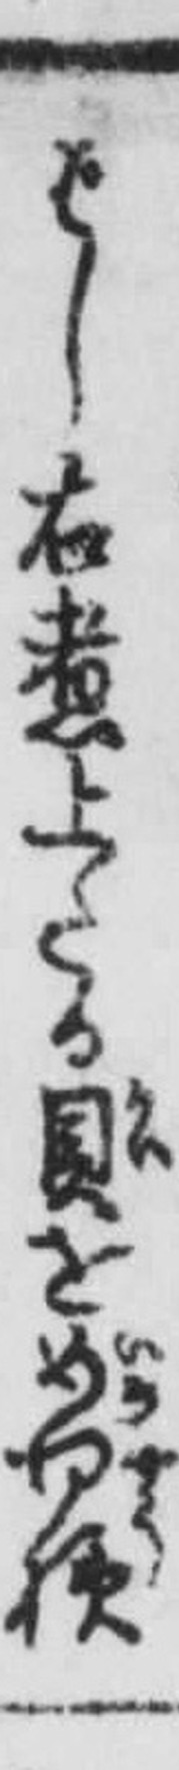ばし右煮上たるを如何様
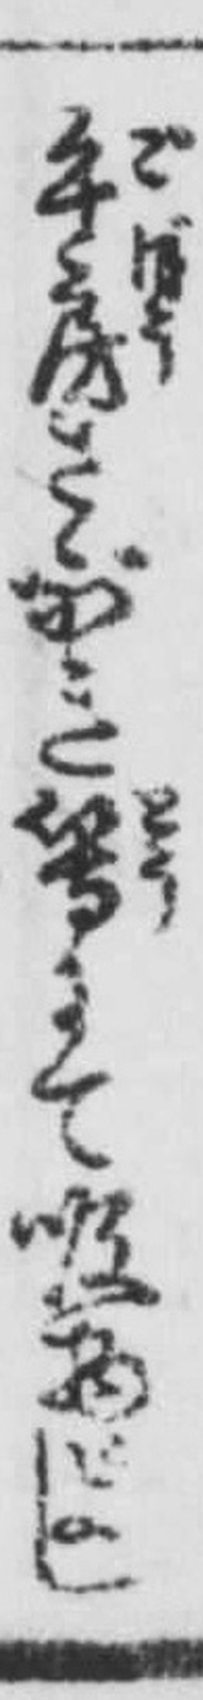牛房さゝがき等にて吸物よし
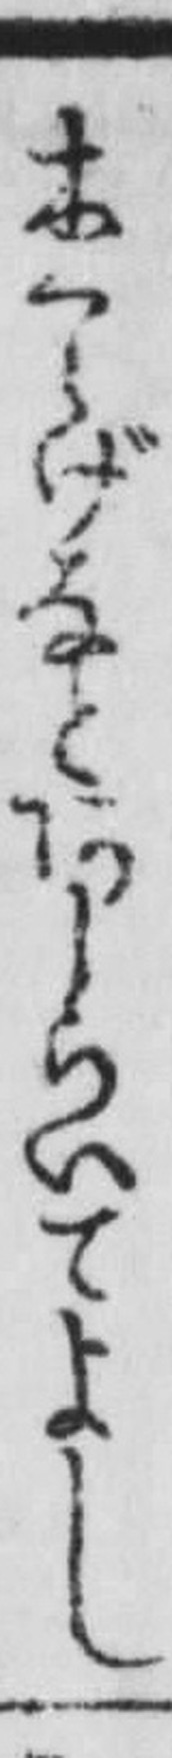木くらげなとあしらいてよし
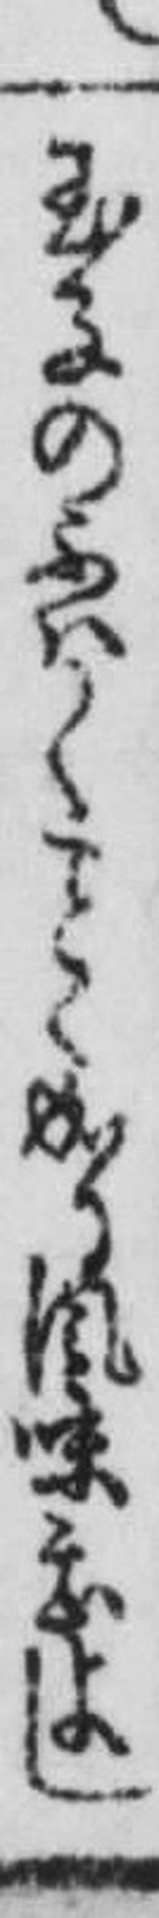玉子のふは〳〵ことく成る風味尤よし
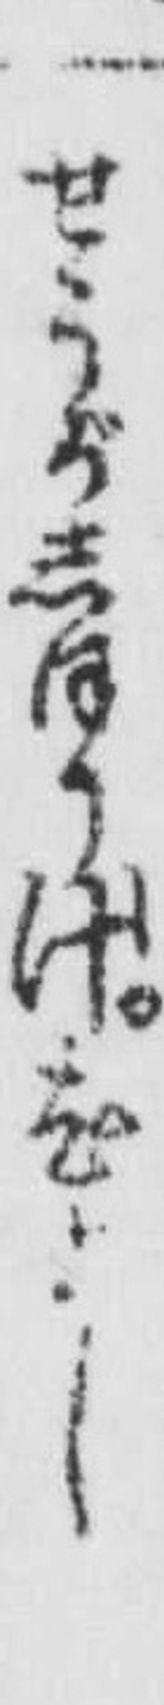せうがしほり汁尤よし
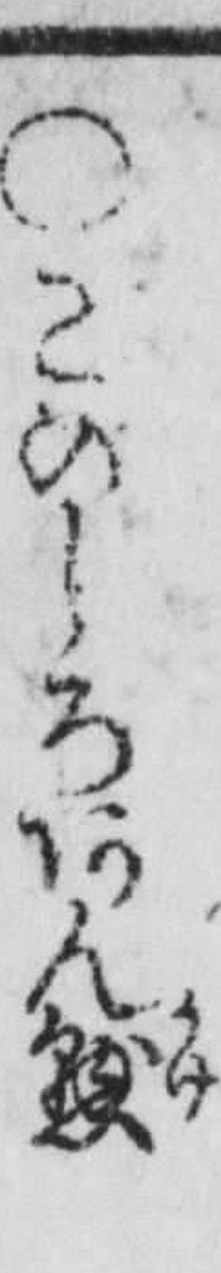○このしろあん懸
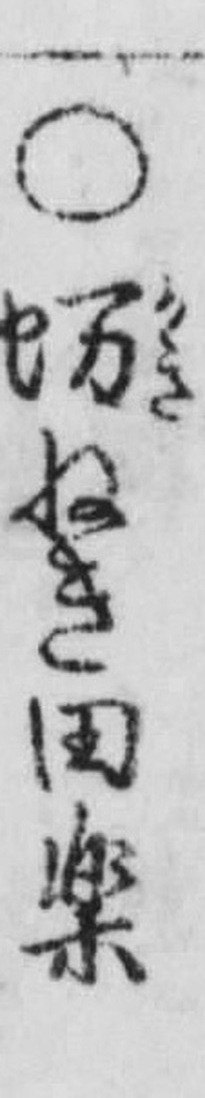○蛎ねき田楽
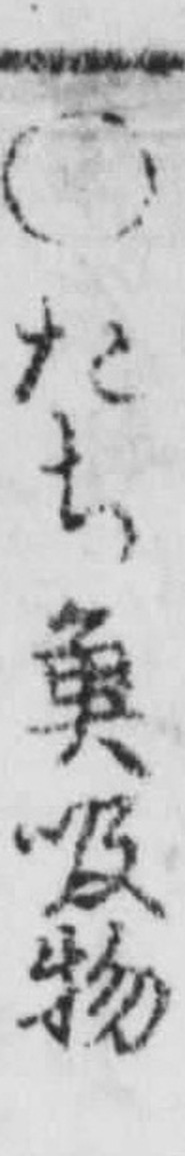○たち魚吸物
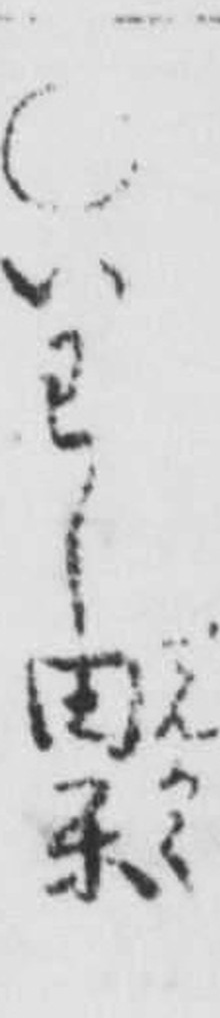○いわし田楽
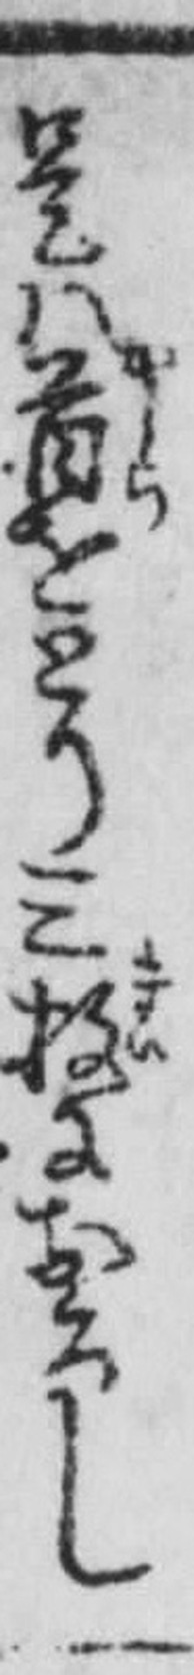是は首をとり三枚におろし
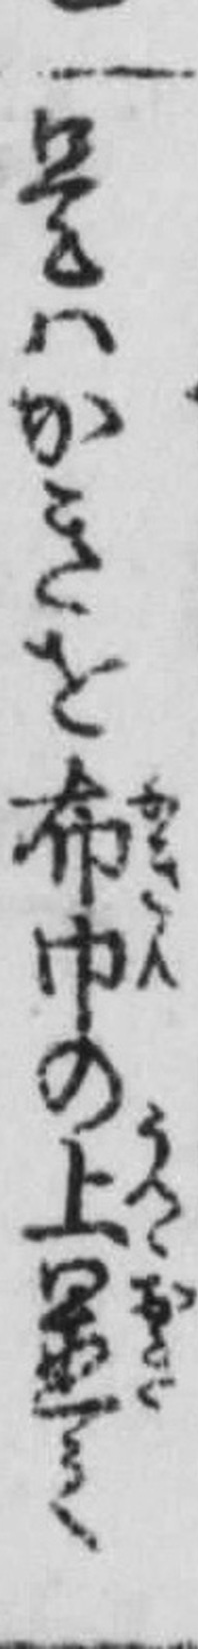是はかきを布巾の上置て
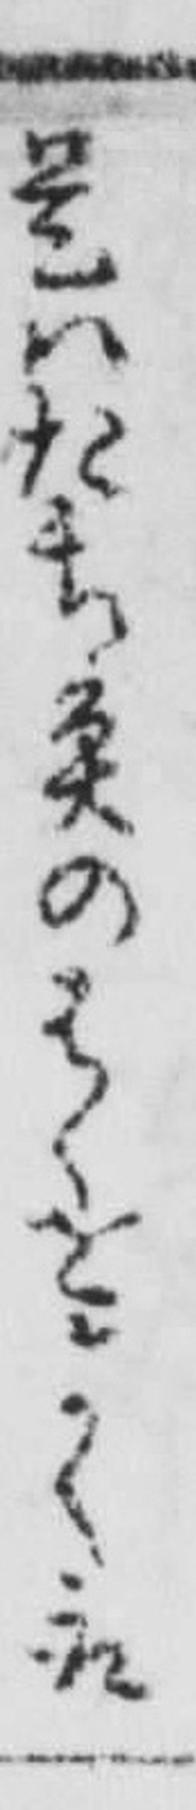是はたち魚のはくをよく取
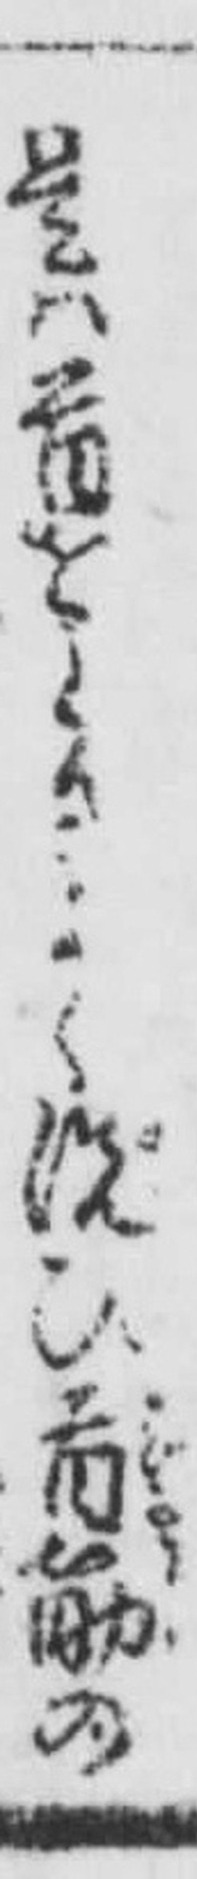是は首をとりよく洗ひ首筋の
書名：精進魚類間合料理/早速庖丁
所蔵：大阪府立大学学術情報センター 国文学研究資料館
